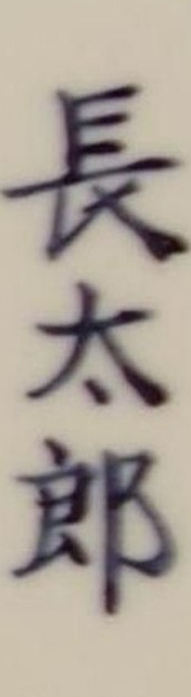長太郎
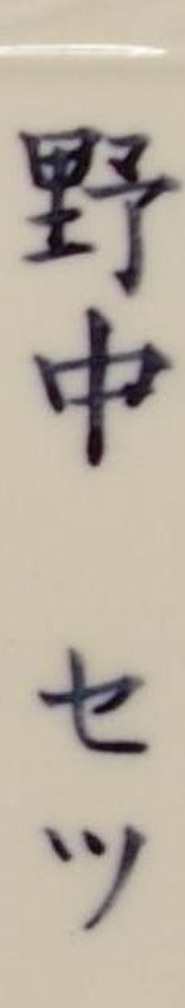野中セツ
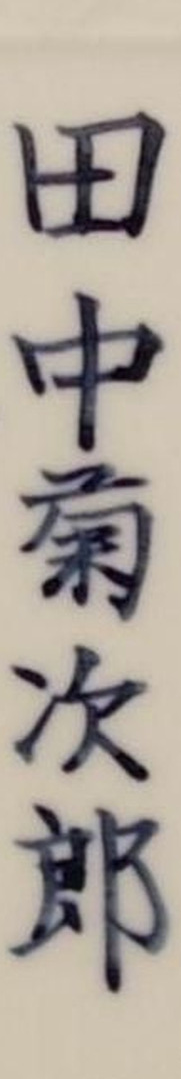田中菊次郎
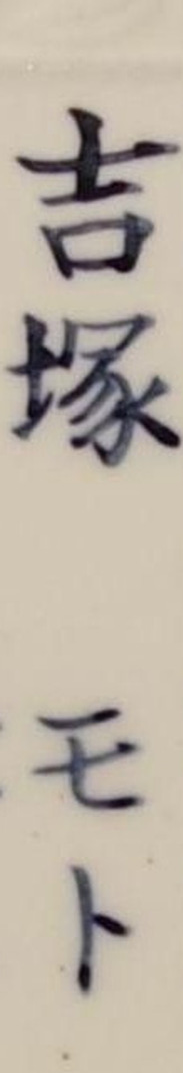吉塚モト
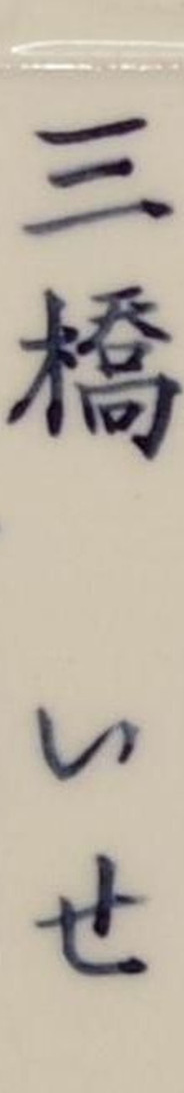三橋いせ
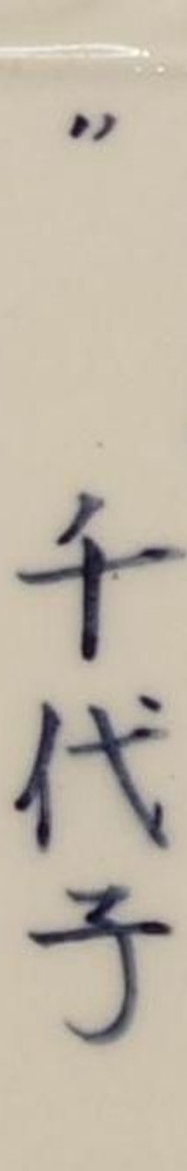千代子
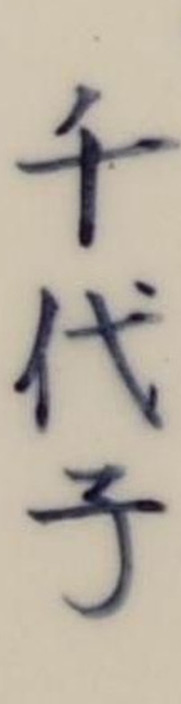千代子
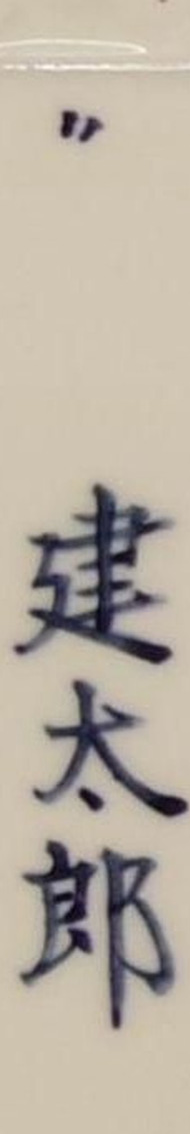建太郎
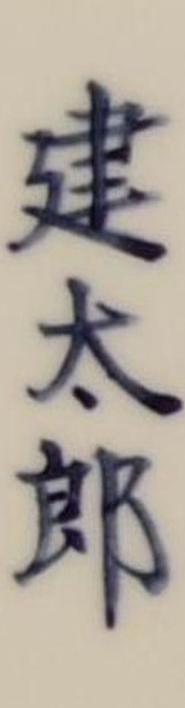建太郎
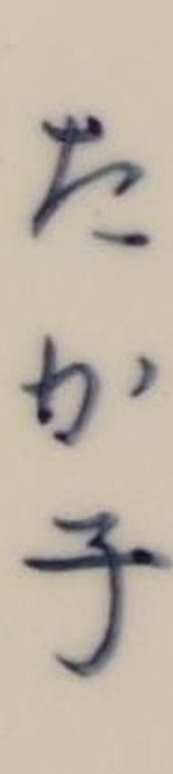たか子
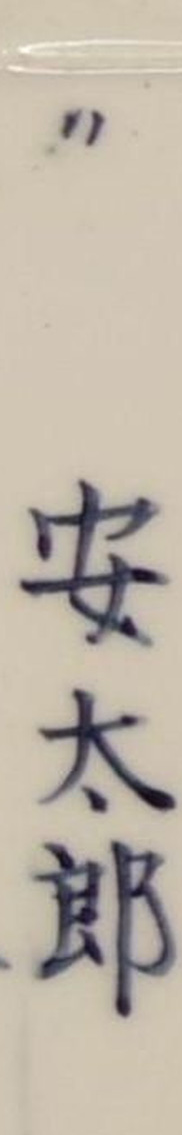安太郎
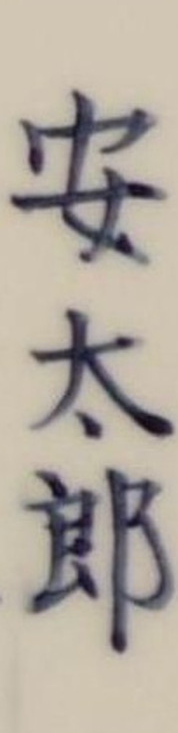安太郎

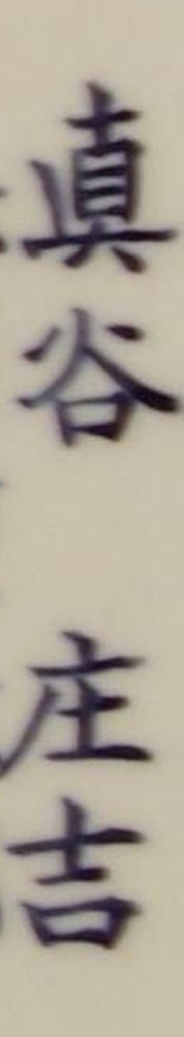真谷庄吉
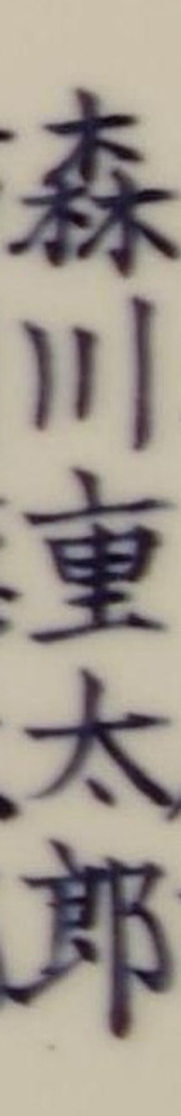森川重太郎
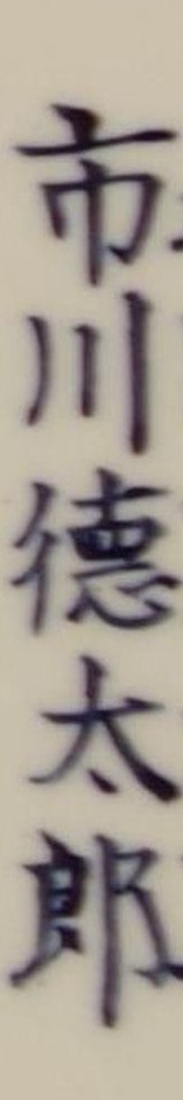市川徳太郎
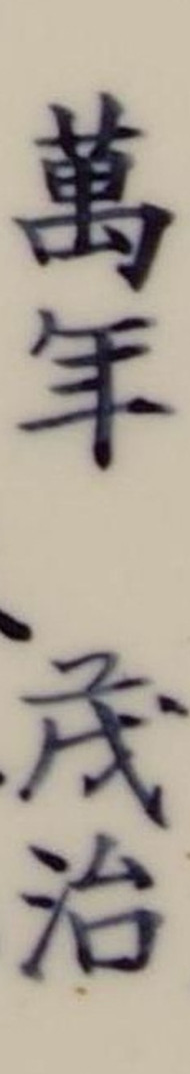萬年茂治
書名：E~L
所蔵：高野山金剛峯寺
